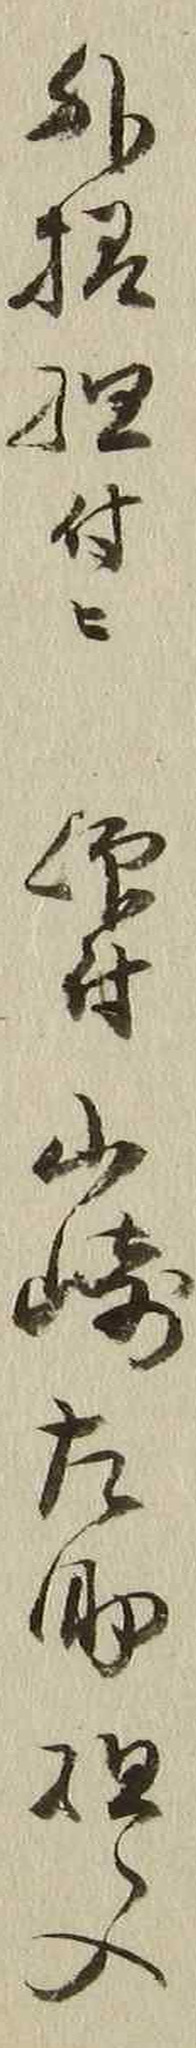外様組付被仰付山崎左助組へ入
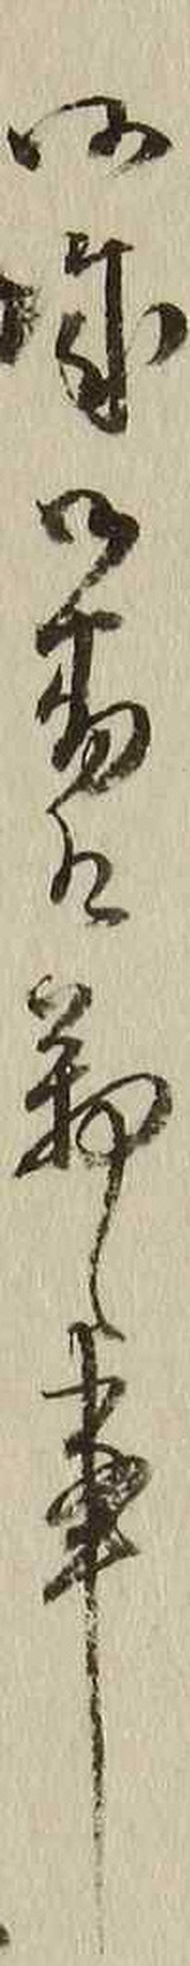御城御番相勤候事
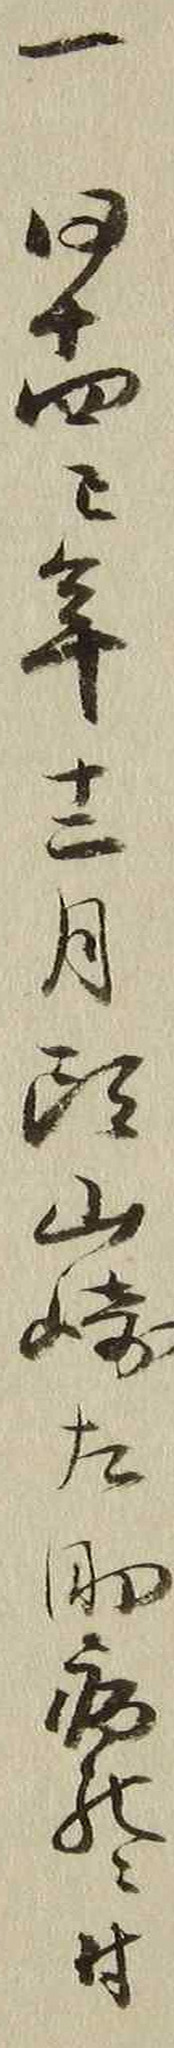一同十四巳年十二月頭山崎左助病死ニ付
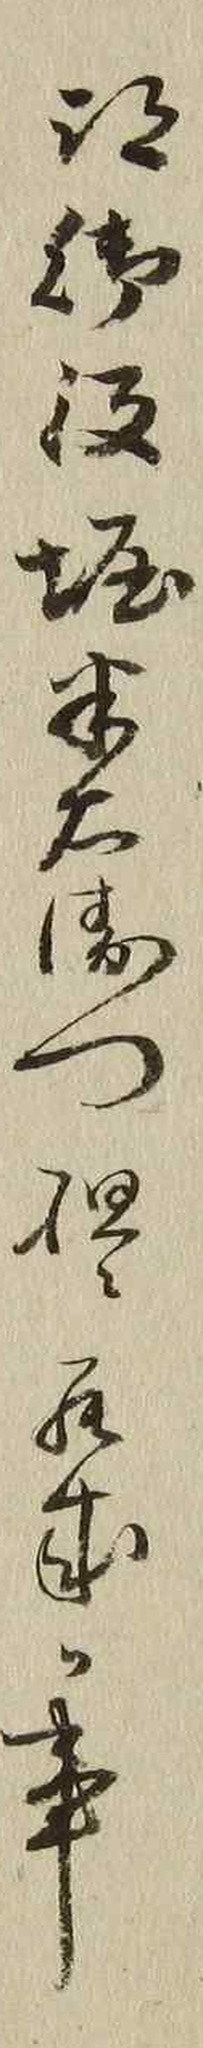跡御役堀半右衛門組ニ罷成候事
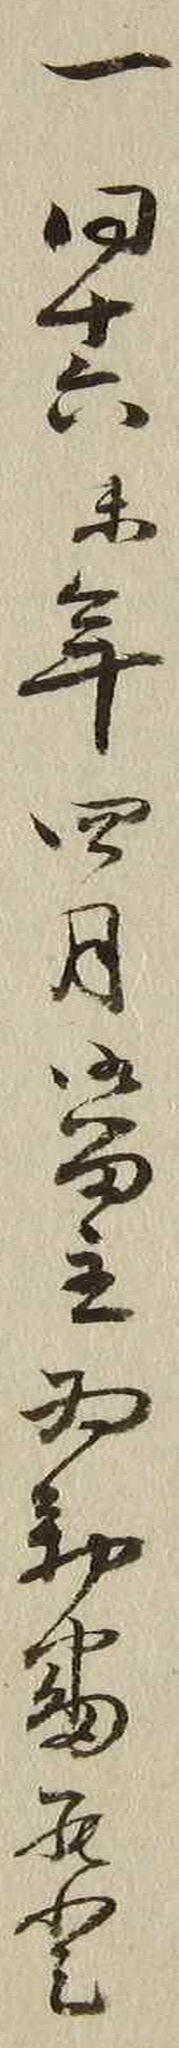一同十六未年四月御留主為勤番罷登
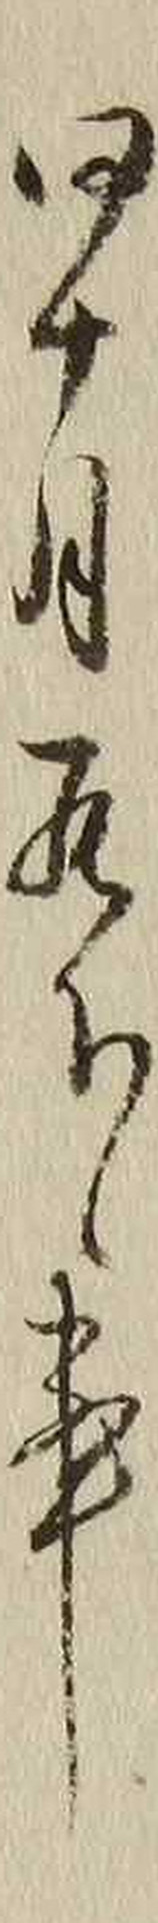同十月罷下候事
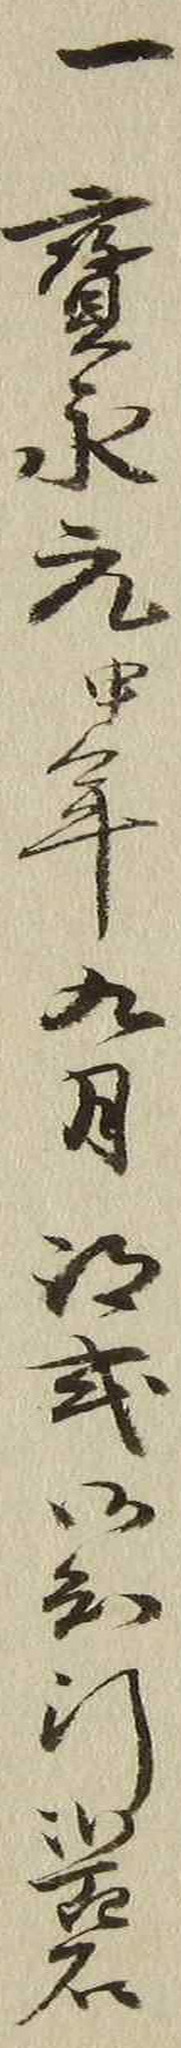一宝永元申年九月跡式御知行弐百石
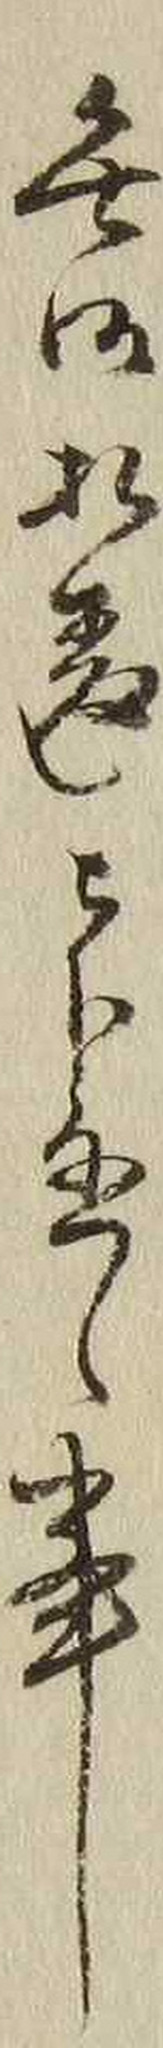無御相違被下置候事
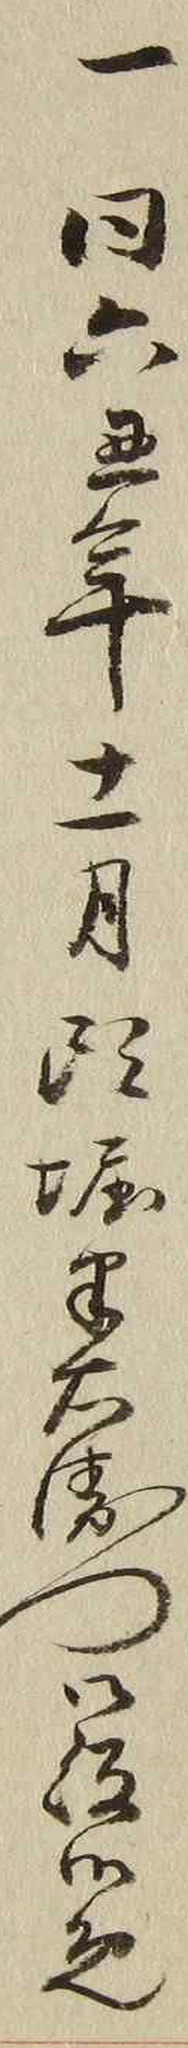一同六丑年十一月頭堀半右衛門御役御免
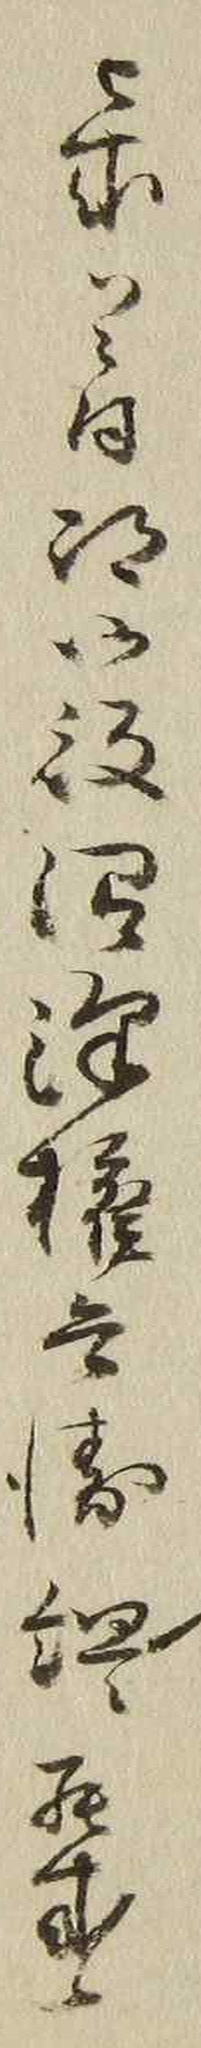被成候ニ付日跡御役沼沢権兵衛組ニ罷成候
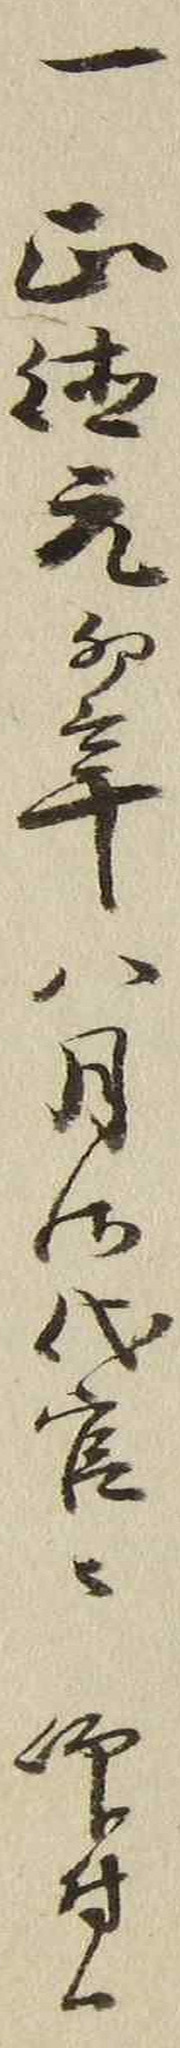一正徳元卯年八月御代官被仰付候

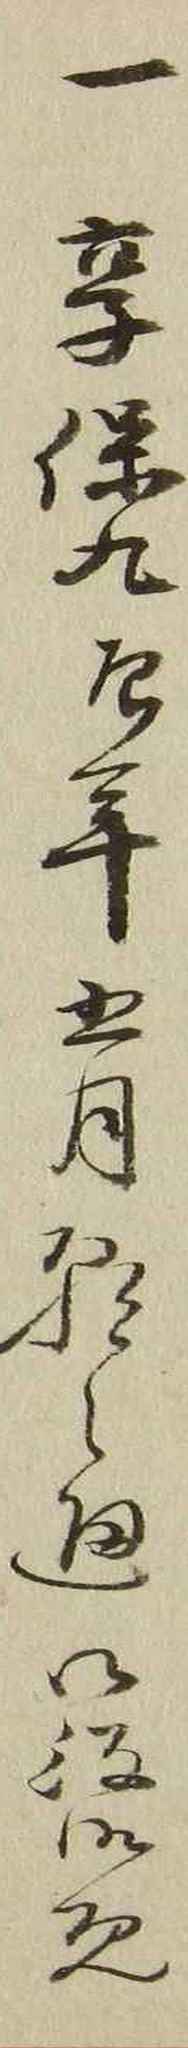一享保九辰年五月願之通御役御免
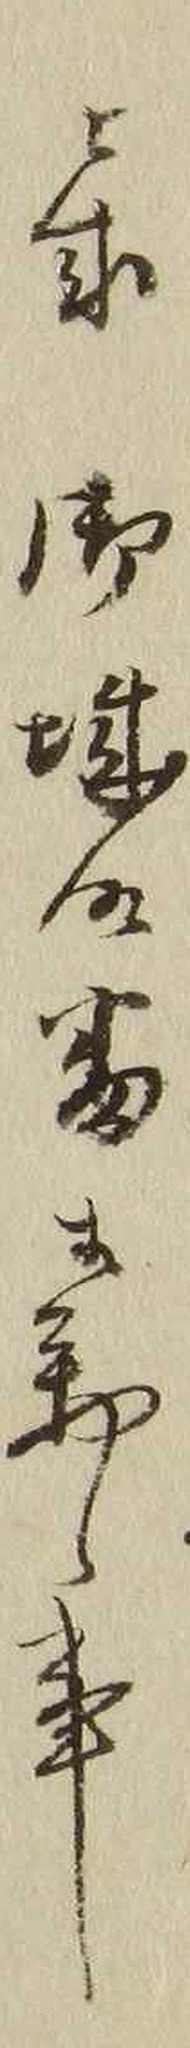被成御城御番相勤候事
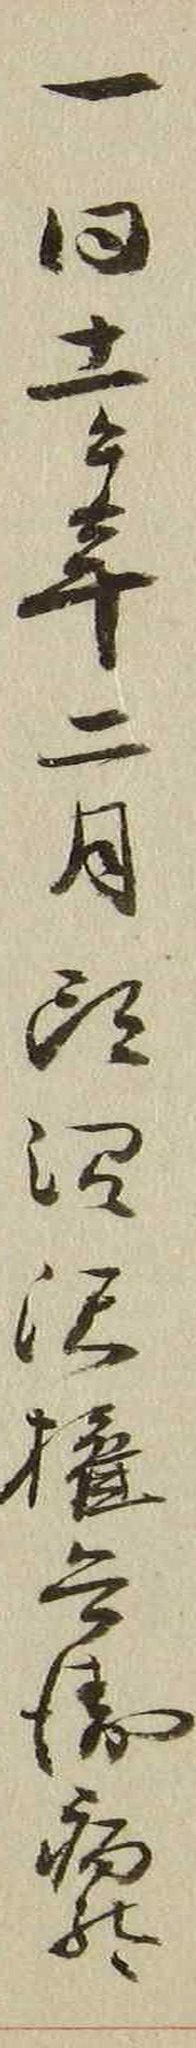一同十一午年二月頭沼沢権兵衛病死ニ
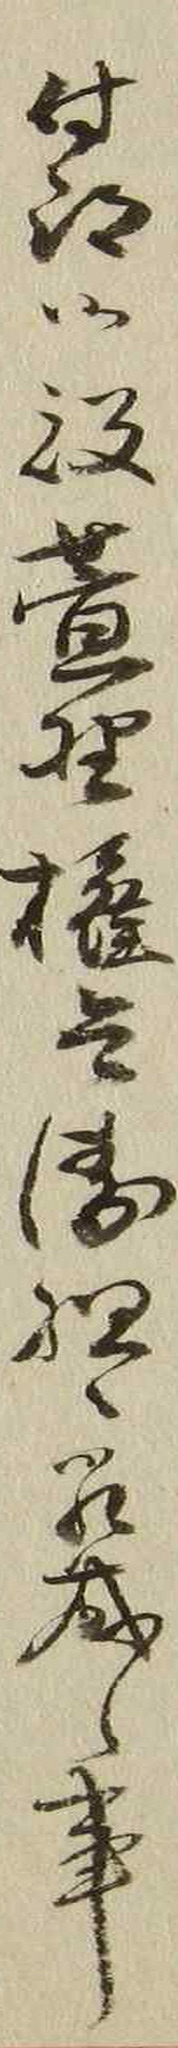付跡御役萱野権兵衛組ニ罷成候事
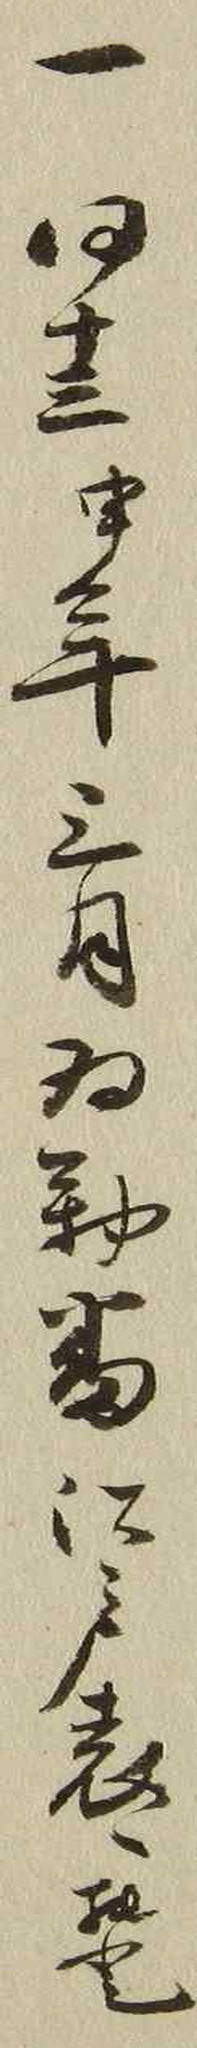一同十三申年三月為勤番江戸表へ罷登
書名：諸士系譜　巻之236　ふ之部4
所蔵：会津若松市立会津図書館
